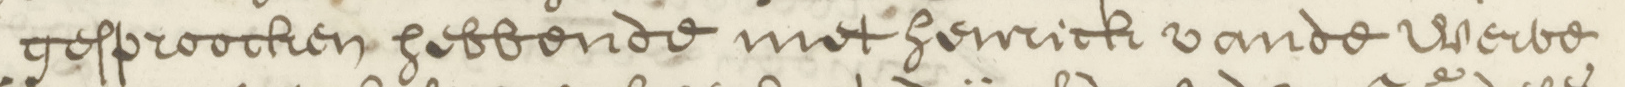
gesproocken hebbende met henrick vande Werve
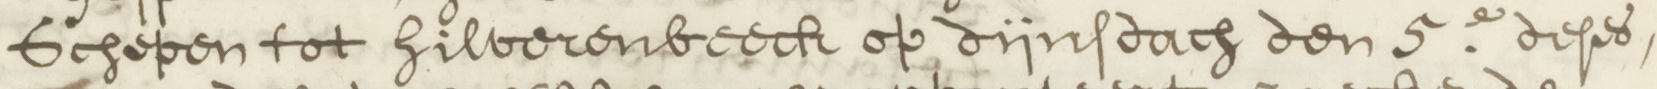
Schepen tot hilverenbeeck op dijnsdach den 5e. deses,
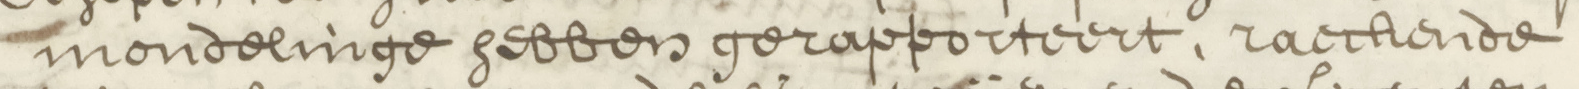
mondelinge hebben gerapporteert, raeckende
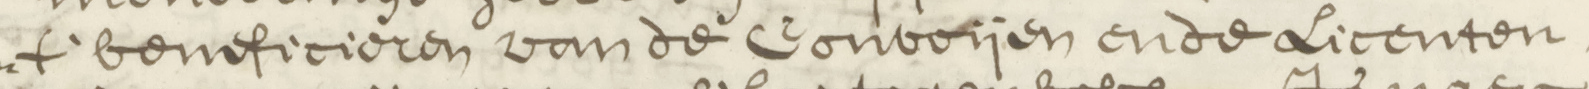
t' beneficieren van de Convoijen ende Licenten,
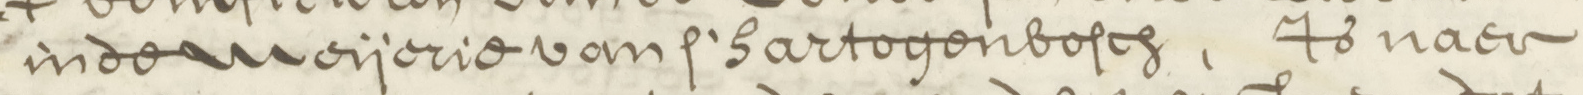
inde Meijerie van s'hartogenbosch. Is naer
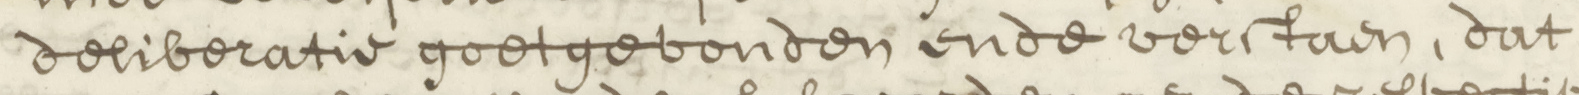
deliberatie goetgevonden ende verstaen, dat
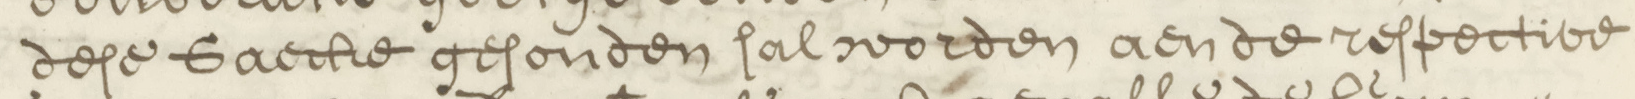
dese Saecke gesonden sal worden aen de respective
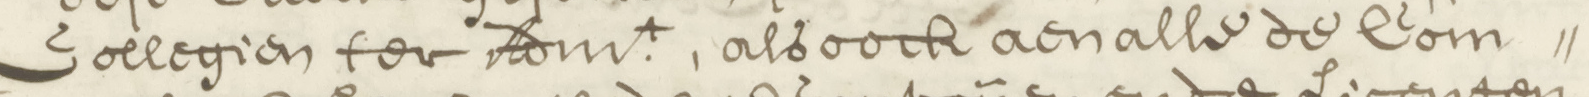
Collegien ter Admt., als oock aen alle de Com„
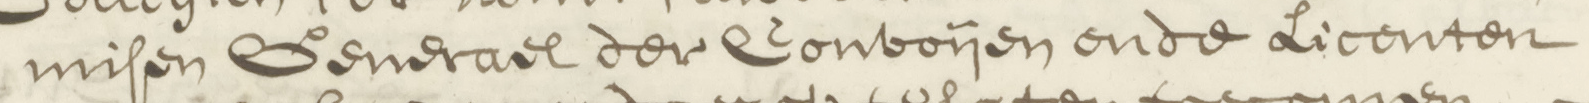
misen Generael der Convoijen ende Licenten
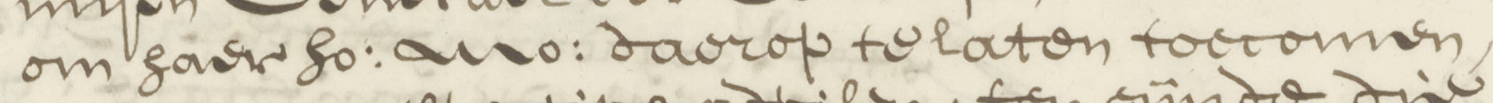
om haer ho:Mo: daerop te laten toecomen,
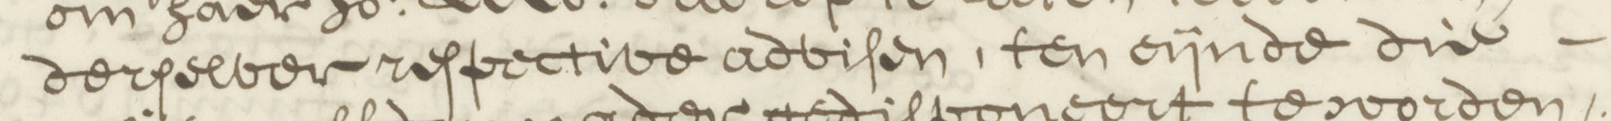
derselver respective advisen, ten eijnde die -
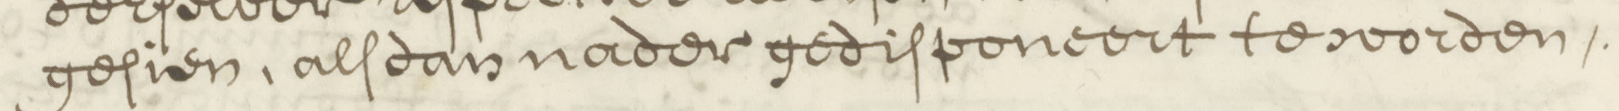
gesien, alsdan nader gedisponeert te worden.
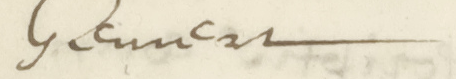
Gemert
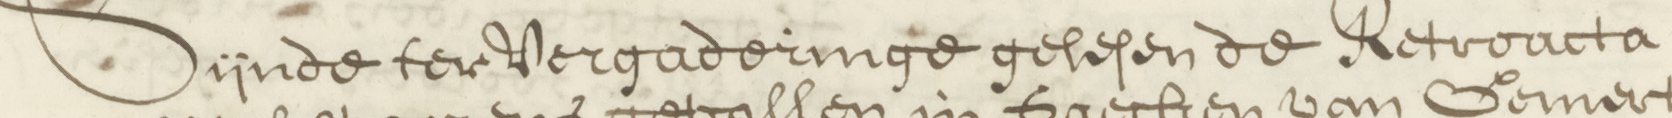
Sijnde ter Vergaderinge gelesen de Retroacta
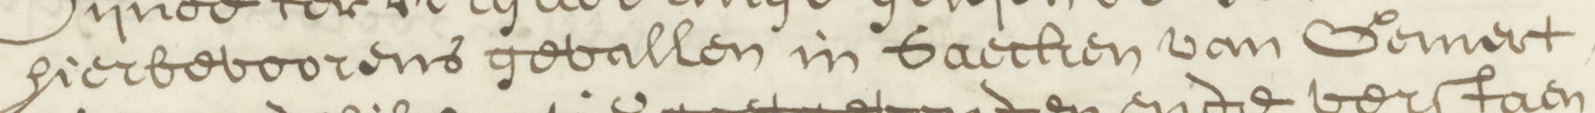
hierbevoorens gevallen in Saecken van Gemert.
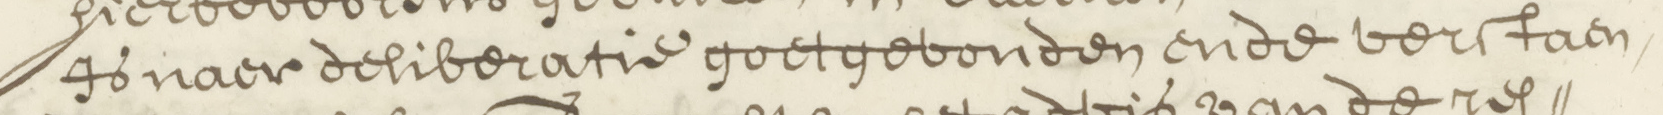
Is naer deliberatie goetgevonden ende verstaen,
